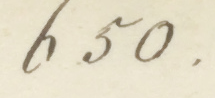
650.
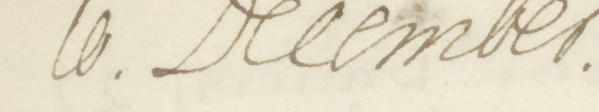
10. December.
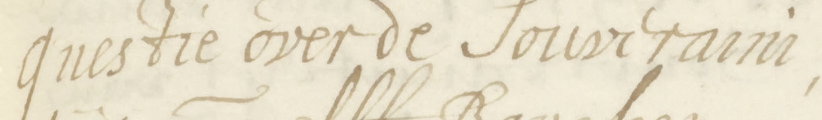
questie over de Souveraini„
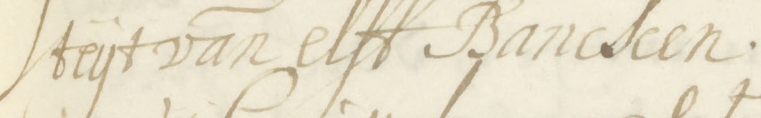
teijt van elff Bancken,
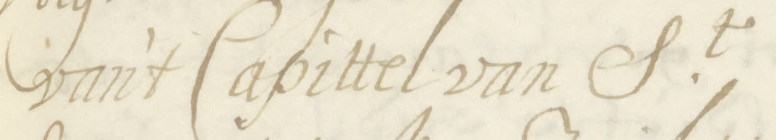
van't Capittel van St.
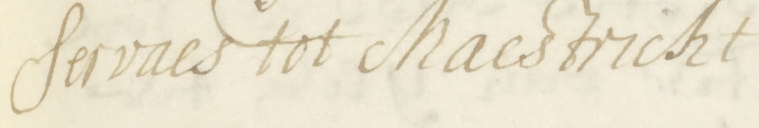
Sevaes tot Maestricht.
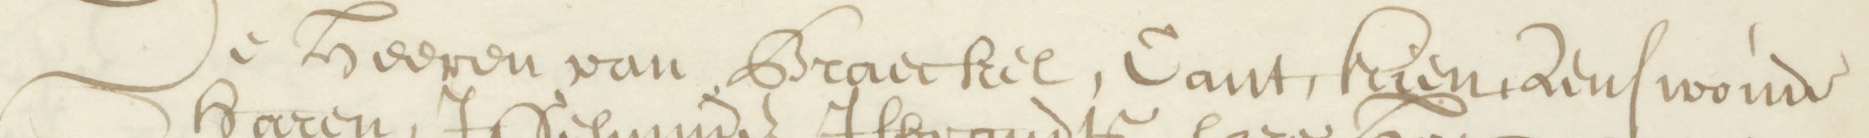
De heeren van Braeckel, Cant, Kien, Renswoude
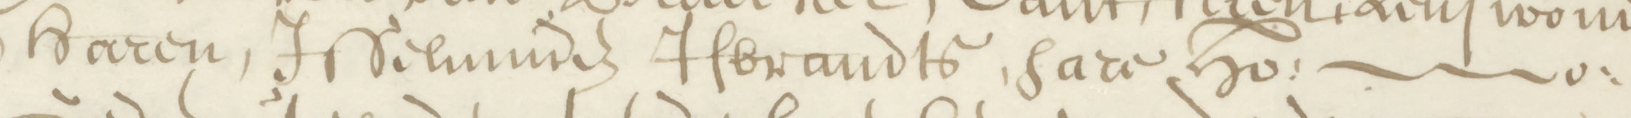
Haren, Isselmuden Isbrandts, hare Ho:Mo:
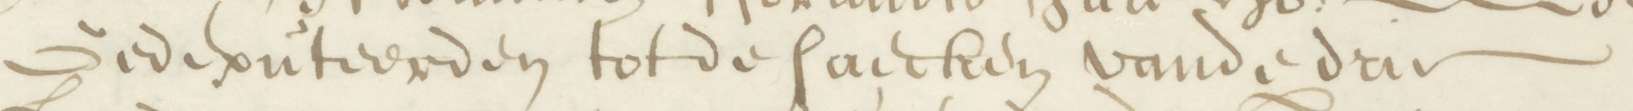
Gedeputeerden tot de saecken vande drie
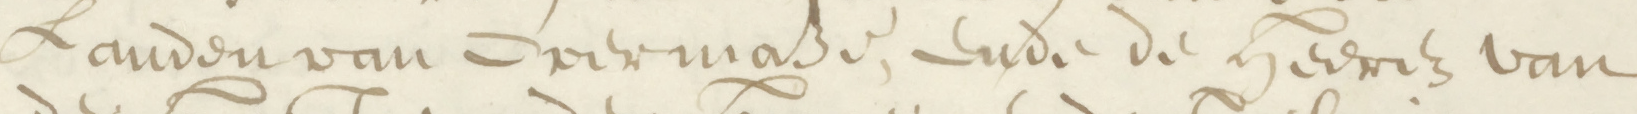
Landen van Overmaze, Ende de Heeren van
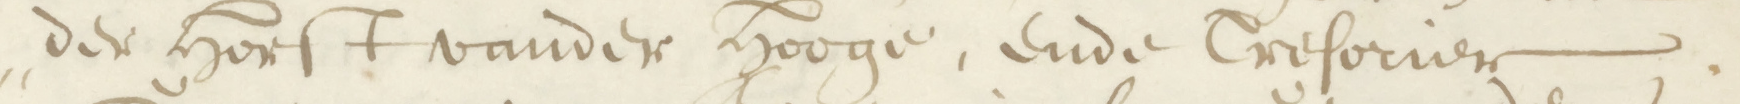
der Herst vander Hooge, ende Tresorier
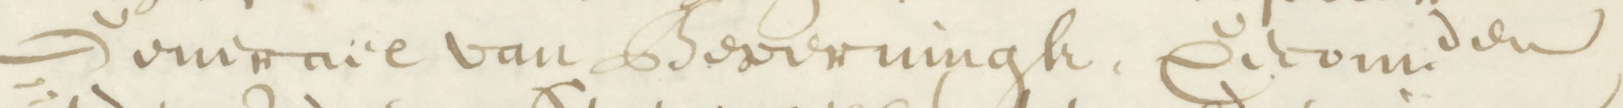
Generael van Beverningk, Gecomden
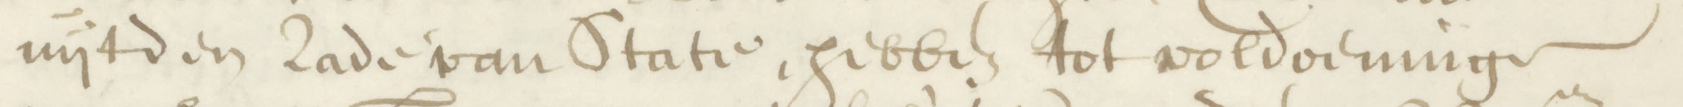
uijtden Rade van State, hebben tot voldoeninge
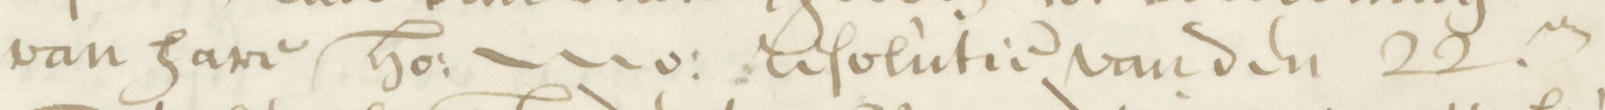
van hare Ho:Mo: resolutie van den 22en.
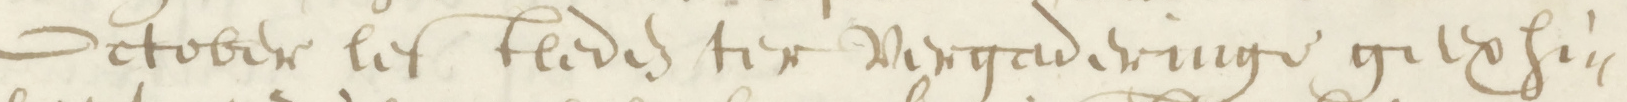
October lestleden ter Vergaderinge geexhi„
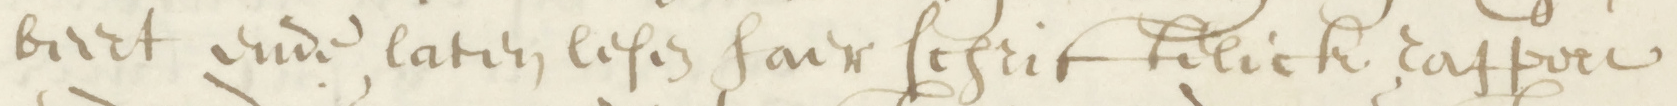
beert ende laten lesen haer schriftelick rapport
